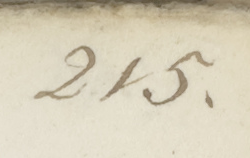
215.
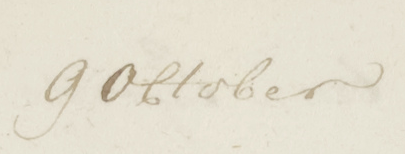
9 october
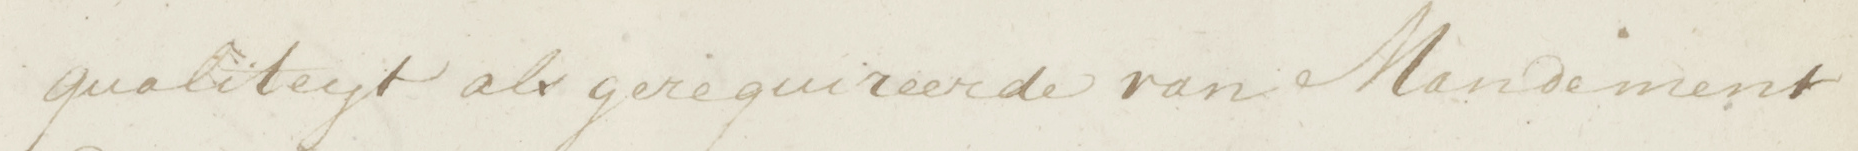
qualiteyt als gerequireerde van Mandement
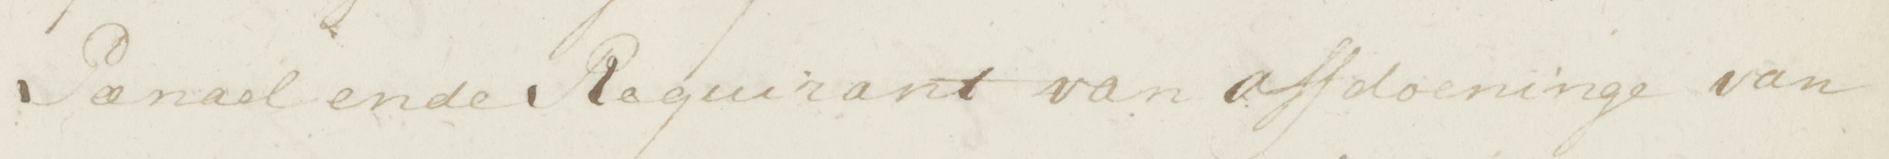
Peenael ende Requirant van affdoeninge van
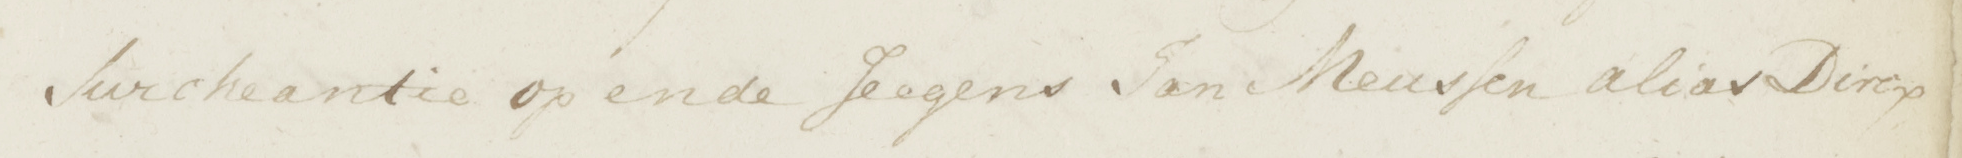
surcheantie op ende Jeegens Jan Meussen alias Dircx
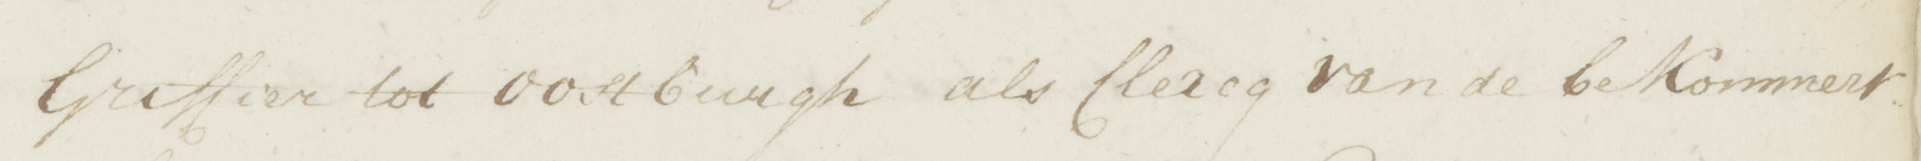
Griffier tot oostburgh als clercq van de bekommert
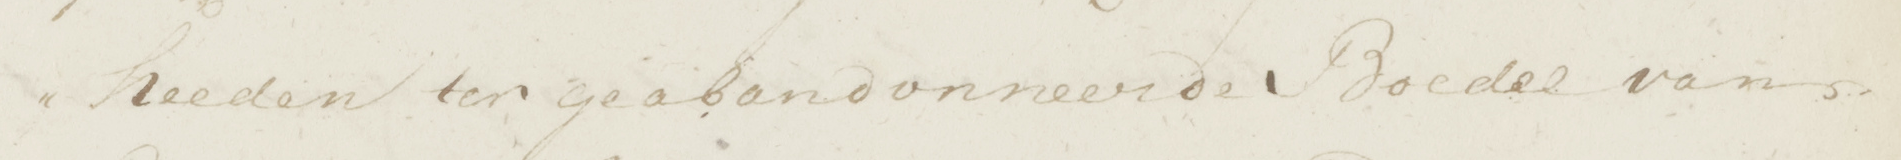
„heeden ter geabandonneerde Boedel van
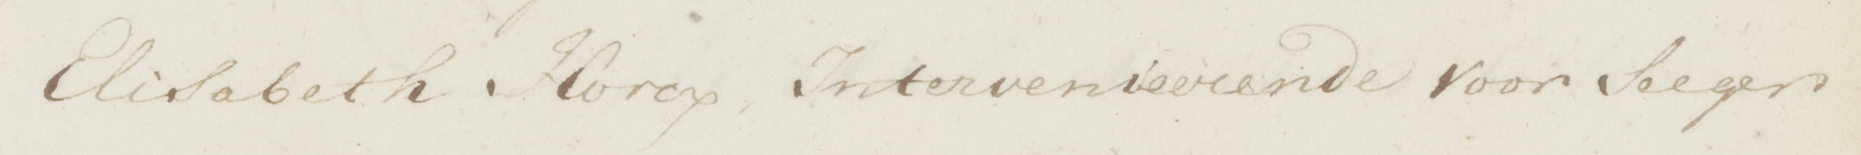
Elisabeth Horcx, Intervenieerende voor seeger
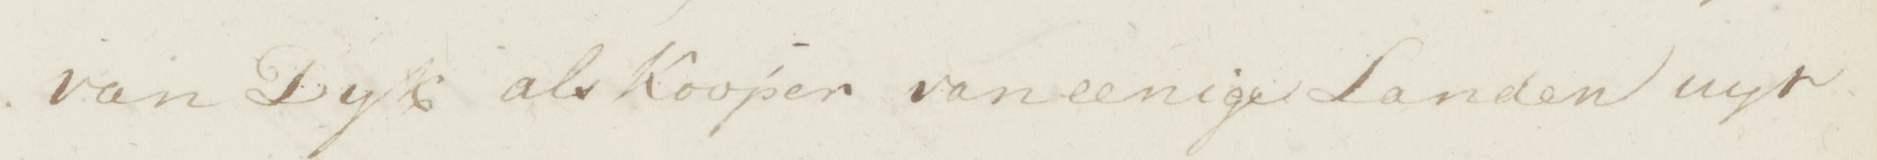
van Dyk als Kooper van eenige Landen uyt
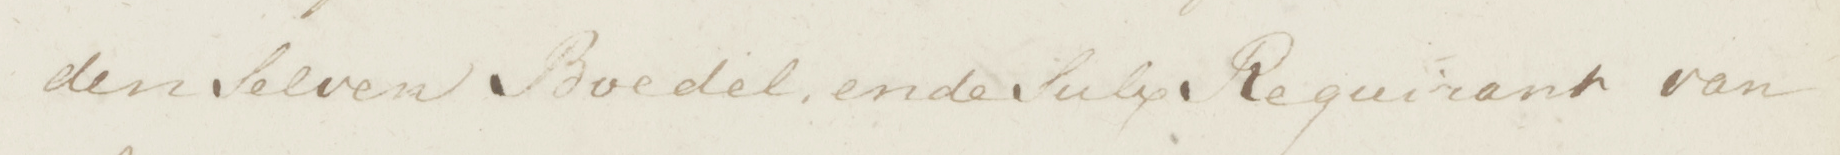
den selven Boedel, ende sulx Requirant van
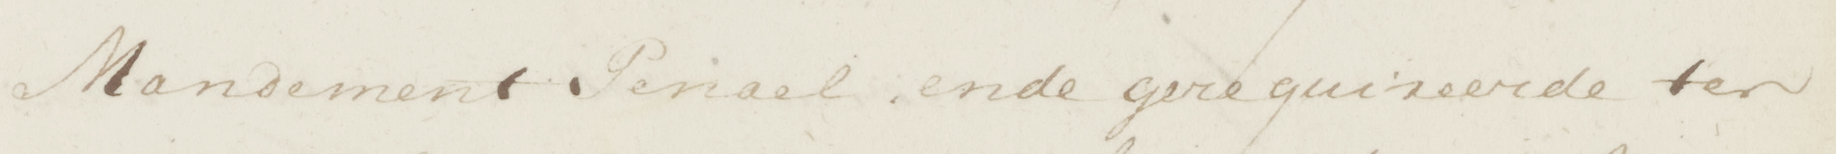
Mandement Penael, ende gerequireerde ter
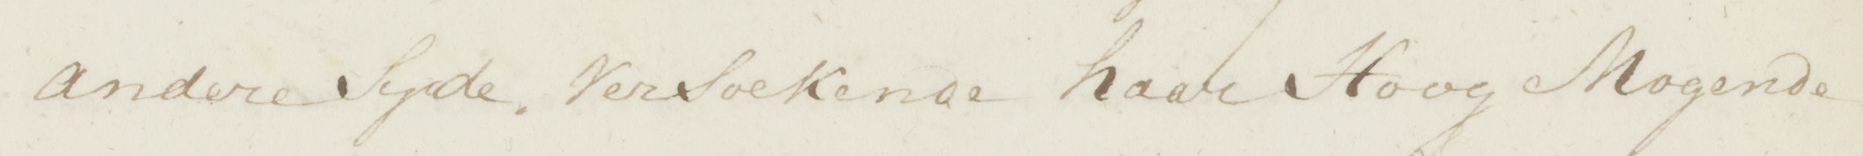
andere syde, versoekende haar Hoog Mogende
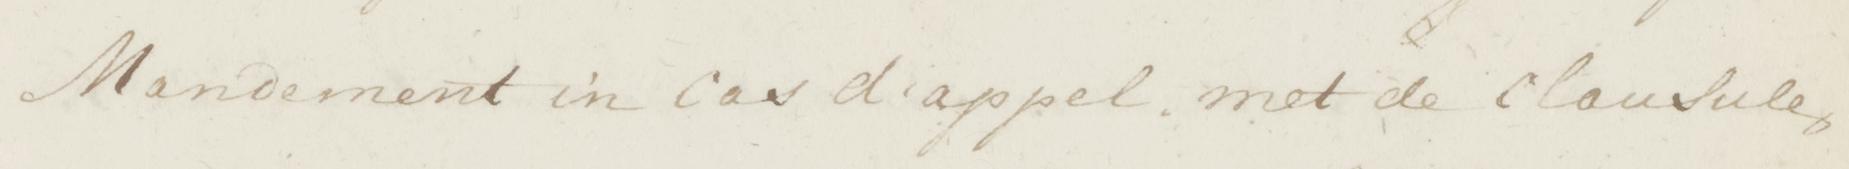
Mandement in cas d'appel, met de clausule
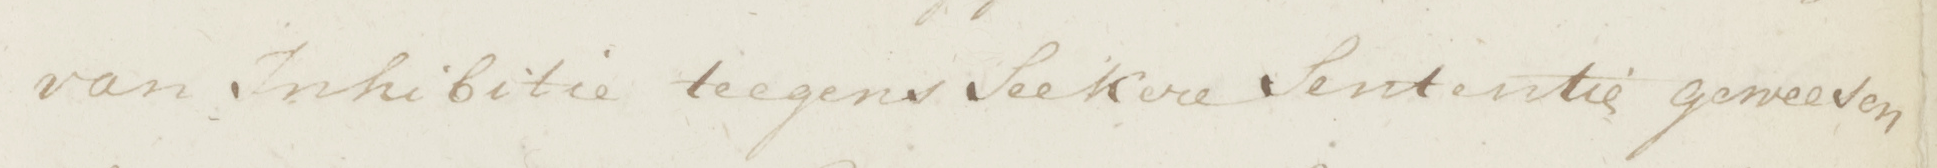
van Inhibitie teegens seekere sententie geweesen
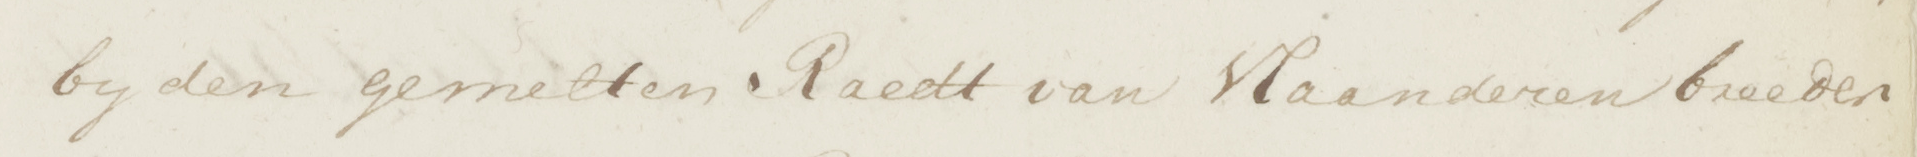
by den gemelten Raedt van Vlaanderen breeder
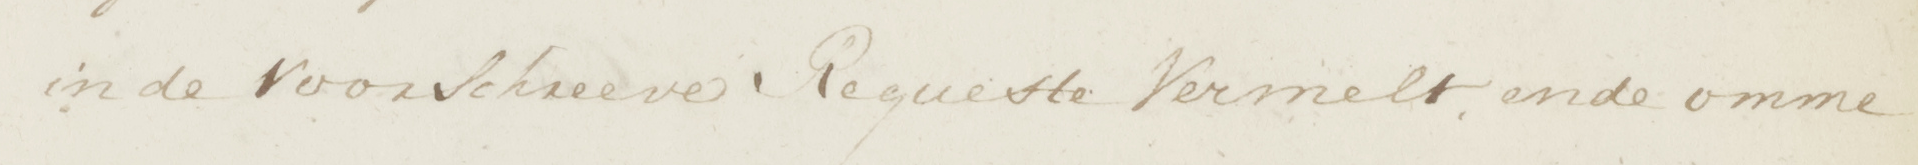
in de voorschreeve Requeste Vermelt, ende omme
